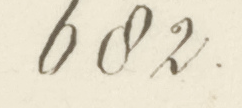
682.
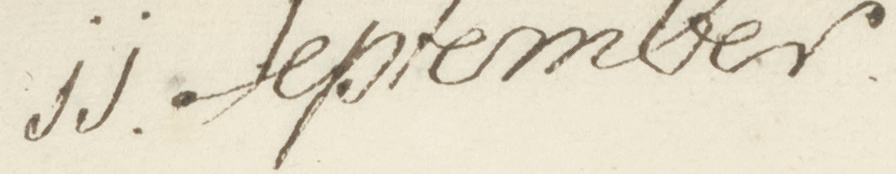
11. September
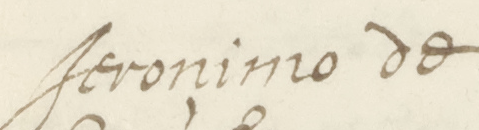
Jeronimo de
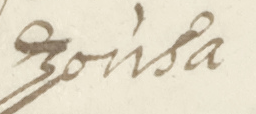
Zousa
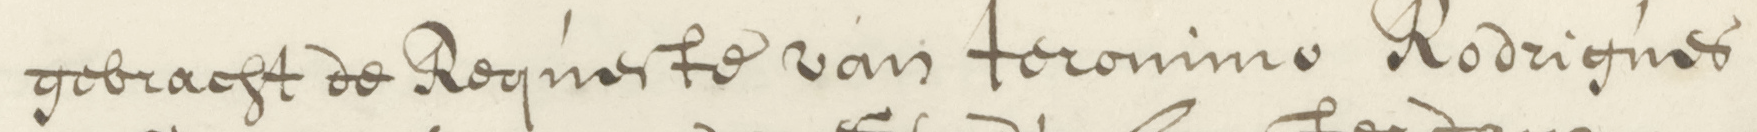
gebracht de Requeste van Jeronimo Rodrigues
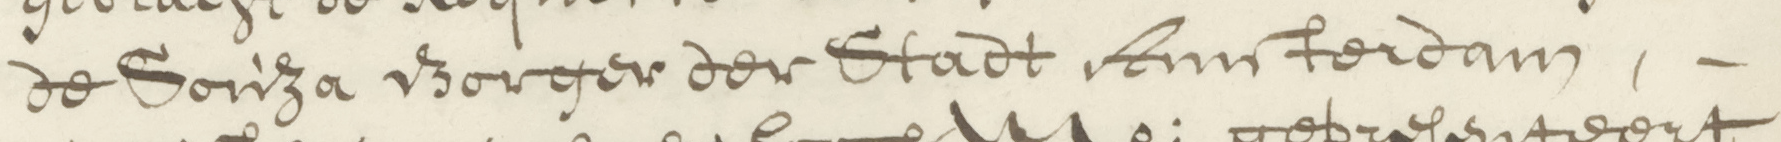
de Souza Borger der Stadt Amsterdam, -
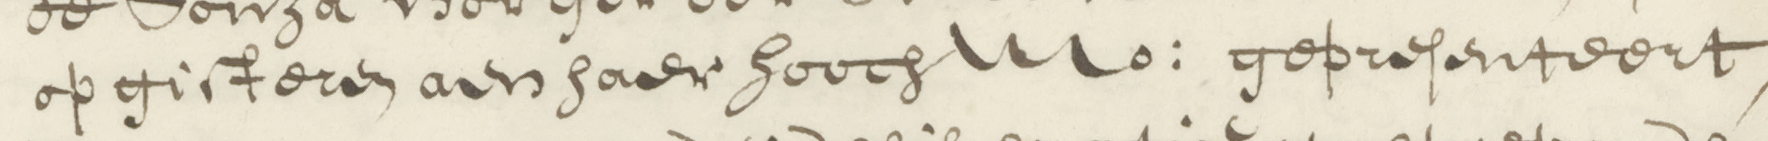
op gisteren aen haer hooch Mo: gepresenteert,
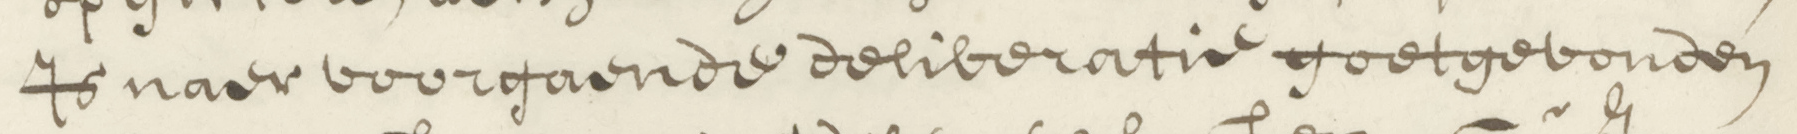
Is naer voorgaende deliberatie goetgevonden
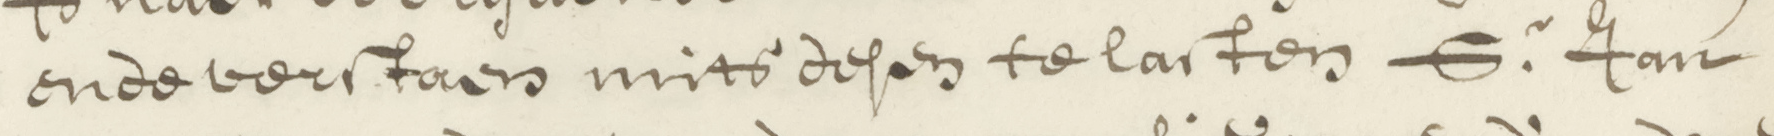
ende verstaen mits desen te lasten Sr. Jan
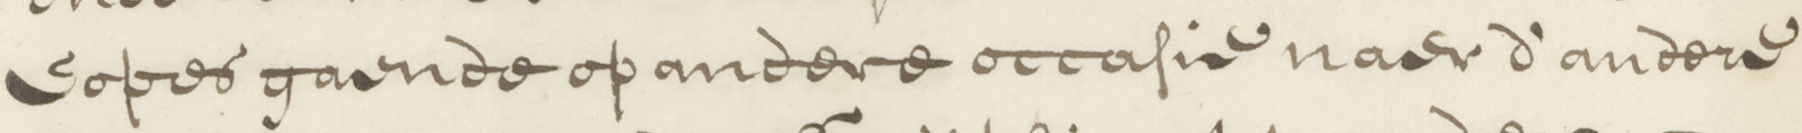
Copes gaende op andere occasie naer d‛andere
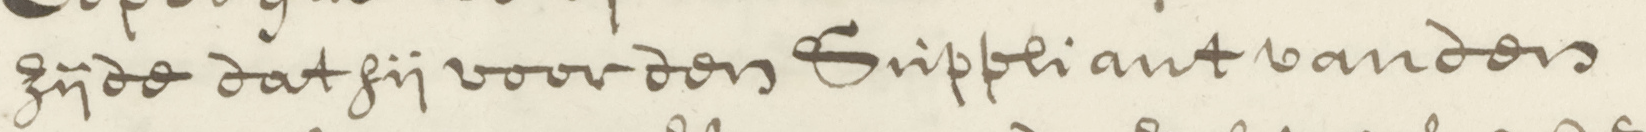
zijde dat hij voor den Suppliant vanden
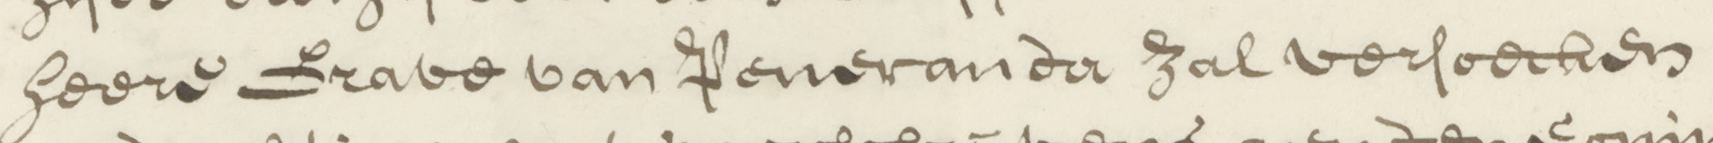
heere Grave van Peneranda zal versoecken
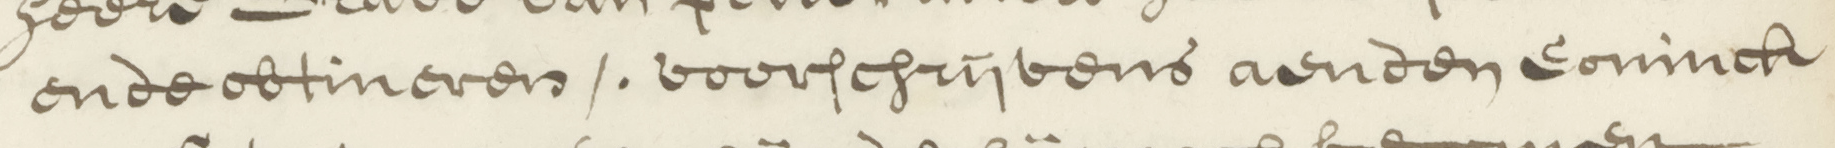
ende obtineren, voorschrijvens aen den Coninck
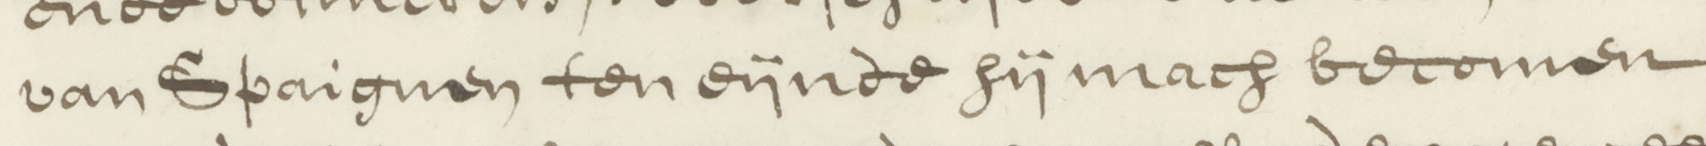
van Spaignen ten eijnde hij mach becomen
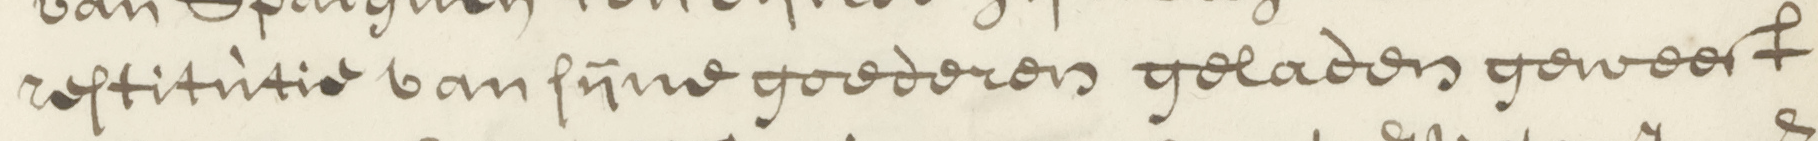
restitutie van sijne goederen geladen geweest
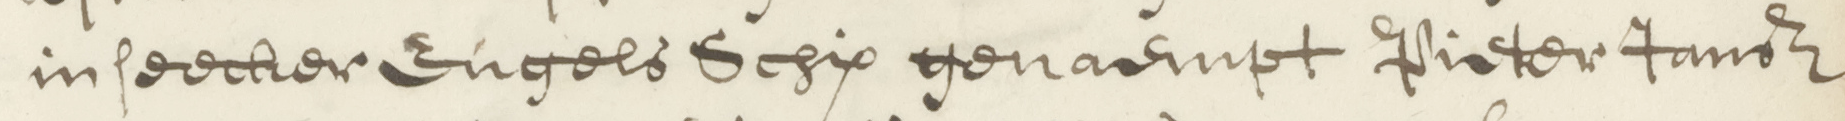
in seecker Engels Schip genaempt Pieter Jansz
